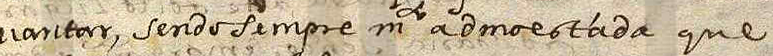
uantar, sendo sempre mto admoestada que
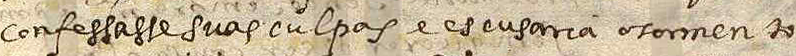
confessasse suas culpas e escusaria o tormento
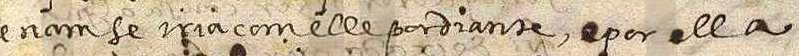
e nam se iria com elle por diante, e por ella
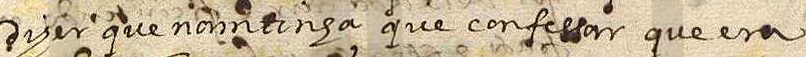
dizer que nam tinha que confessar que era
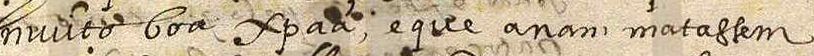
muito boa Xpaã, e que a nam matassem
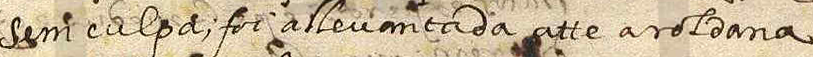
sem culpa; foi alleuantada atte a roLdana
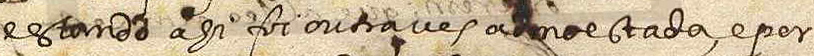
estando ahi foi outra ues admoestada, e por
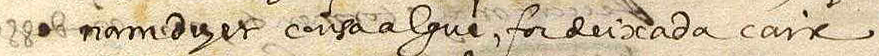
nam dizer cousa alguā, foi deixada cair
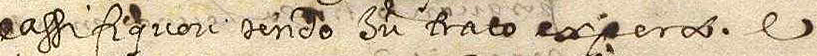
e assi fiquou tendo hū trato experto. e
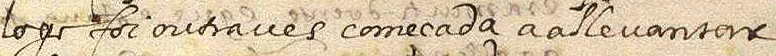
logo foi outra ues começada a alleuantar
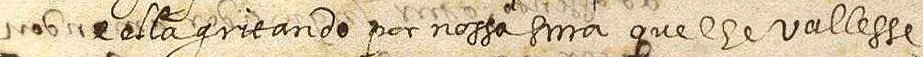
e ella gritando por nossa snrā que lhe vallesse
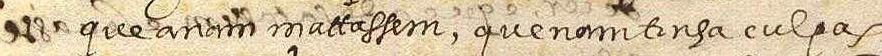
que a nam mattassem, que nam tinha culpas
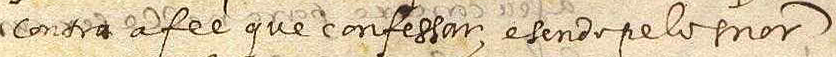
contra a feé que confessar, e sendo pelo snor̄
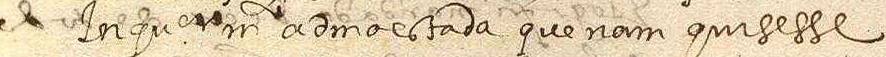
Inqu.or mto admoestada que nam quisesse
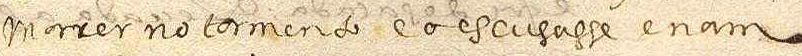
morrer no tormento e o escusasse e nam
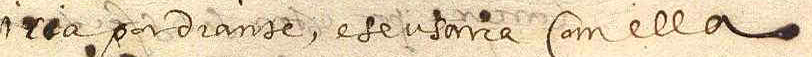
iria por diante, e se usaria com ella
